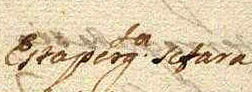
Esta perg.ta se fará
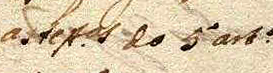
as test.as do 5.o art.o
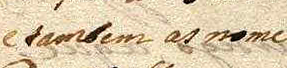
e tambem as nome
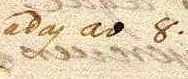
adas ao 8.
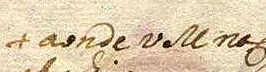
+ aonde v M naõ
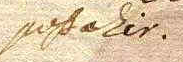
possa hir.
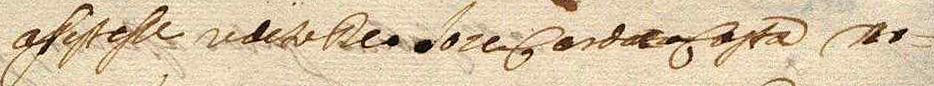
assistesse o dito Reo Ioze Cardozo Costa no
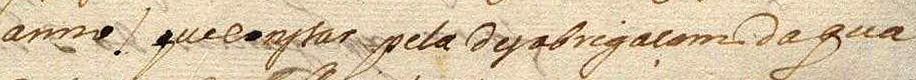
anno / que constar pela desobrigaçam da qua
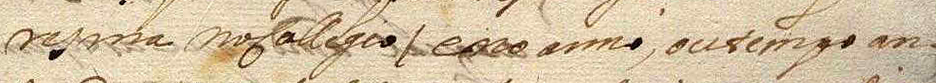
resma no Collegio / e no anno, ou tempo an
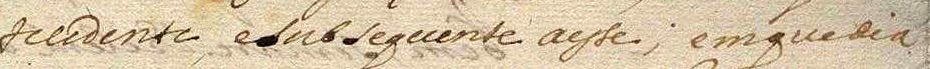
tecedente, e subsequente a este; em que dia
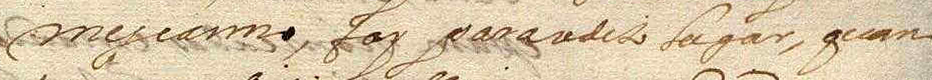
mes e anno, foy para o dito lugar, quan
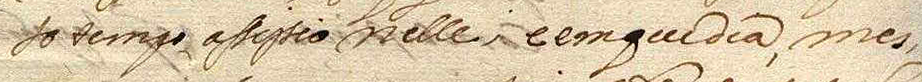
to tempo assistio nelle, e em que dia, mes,
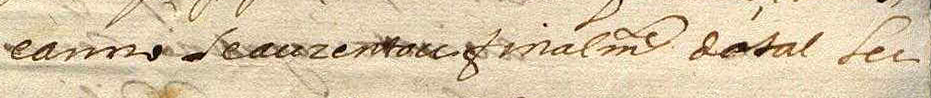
e anno se auzentou finalmte do tal Lu
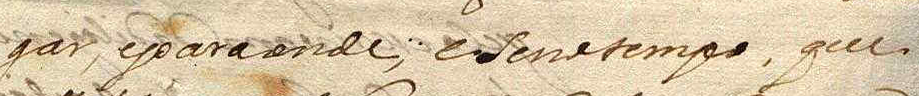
gar, e para onde; e se no tempo, que
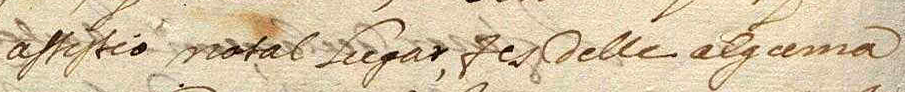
assistio no tal Lugar, fes delle alguma
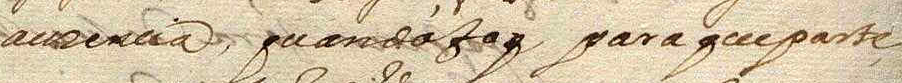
auzencia, quando fez, para que parte
